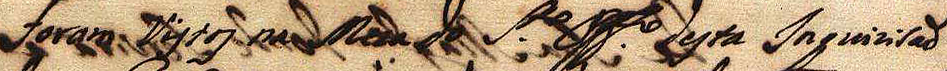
foram Vistos na Meza do S.to Off.o desta Inquizisaõ
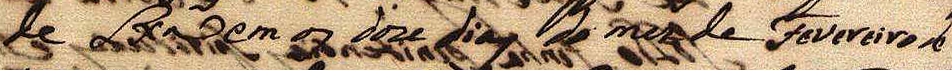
de Lxa em os doze dias do mez de Fevereiro de
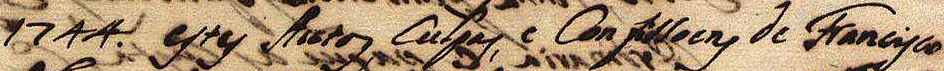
1744. estes Autos, Culpas e Confissoens de Francisco
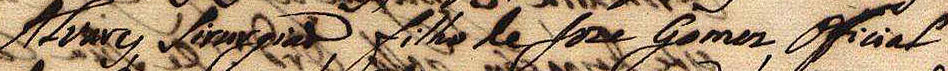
Alvares, Sirurgiaõ, filho de Joze Gomez, Official
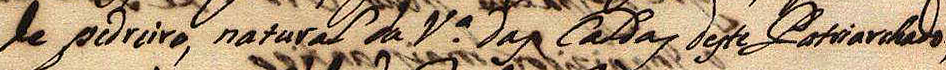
de pedreiro, natural da V.a das Caldas deste Patriarchado,
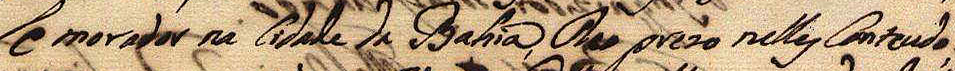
e morador na Cidade da Bahia, Reo prezo nelles Conteudo;
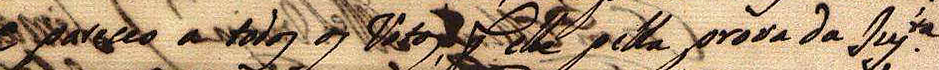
e pareceo a todos os Votos, q̄ elle pella prova de Jus.ta
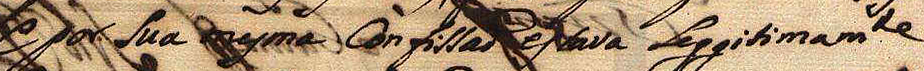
e por sua mesma Confissaõ estava Leggitimamte
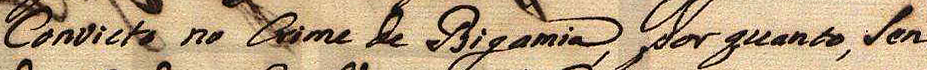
Convicto no Crime de Bigamia, por quanto, sen
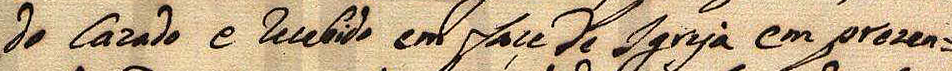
do Cazado e Recebido em façe de Igreja em prezen
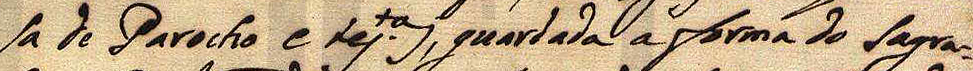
sa de Parocho e tes.tas, guardada a forma do sagra
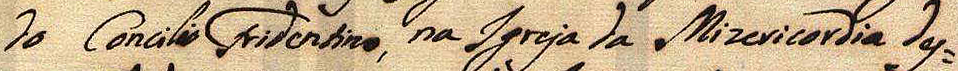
do Concilio Tridentino, na Igreja da Mizericordia des
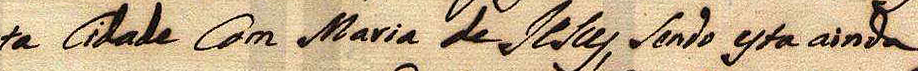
ta Cidade Com Maria de Iesus, sendo esta ainda
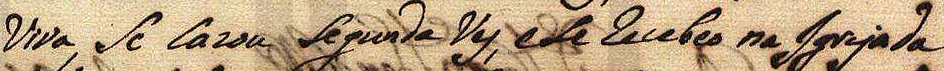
Viva, se cazou segunda Ves, e se Recebeo na Jgreja da
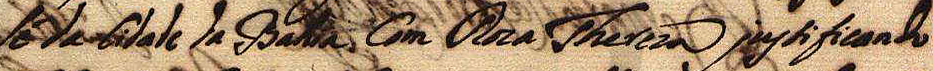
Sé da Cidade da Bahia, Com Roza Thereza justificando
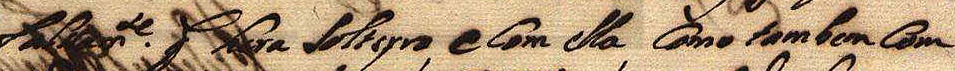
falsam.te q̄ hera solteyro, e com ella, como tambem com
